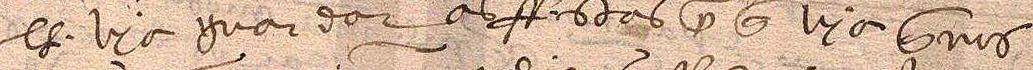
lhe vya guardar as ffestas p̄oq̄ vya q̄ nos
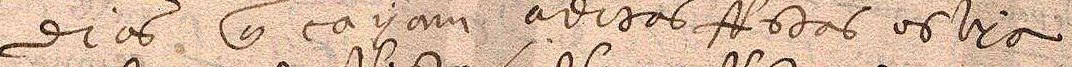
dias q̄ cayam a ditas ffestas os vya
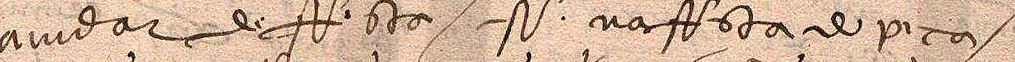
amdar de ffesta / -ss. na ffesta do peça /
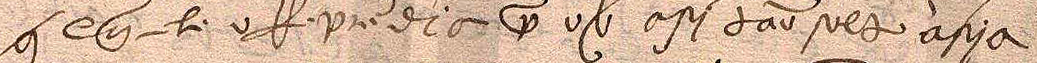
q e q̄ ele o Repreēdia p̄o o ꝟ asy tão solto asy a
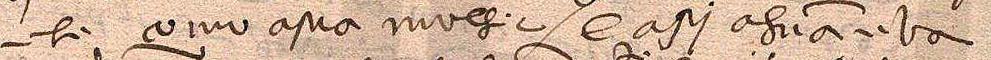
ele como a sua molher / e asy a huā eva
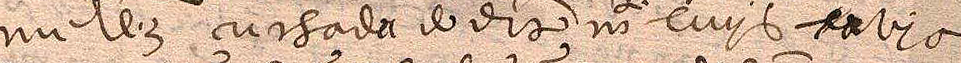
medēz cunhada do dito mte luys _a vya
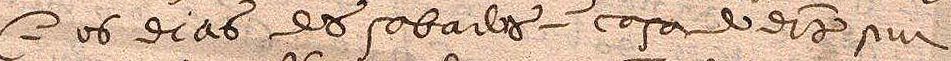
ē os dias dos sabados ē casa do dito seu
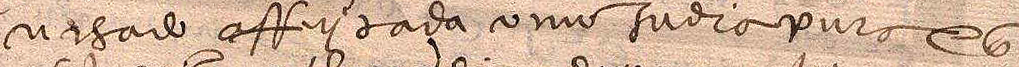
cunhado affeytada como Judia pura e q̄
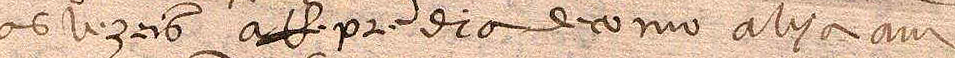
as vezees a Repreēdia de como a vya am
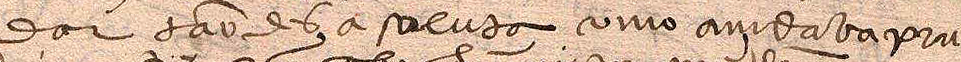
dar tão desasoluta como amdava pru
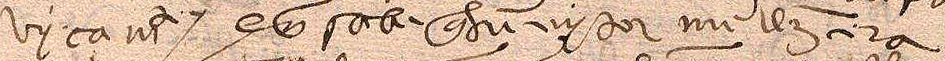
vycamte / e q̄ sabe q̄ hū eytor mēdez era
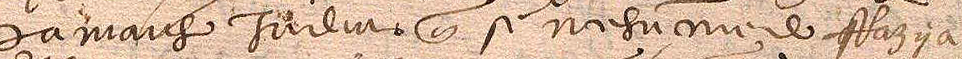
tamanho Judeu q̄ sē nehū medo ffazya
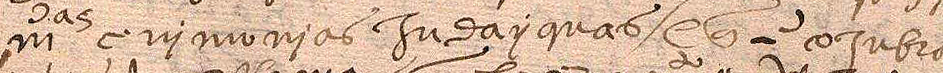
mtas çerymonjas Judayquas / e q̄ ē coJnbra
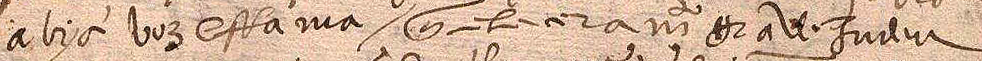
avya voz e ffama / q̄ ele era mto grāde Judeu
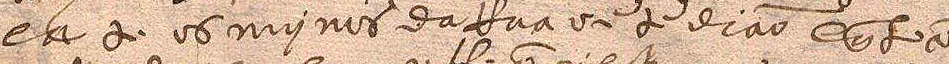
e ate os mynos da Rua o ētēdião e q̄ ho cō
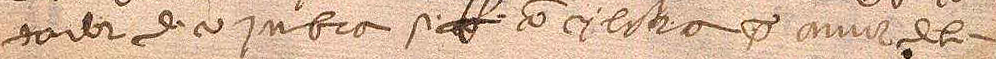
tador de cojnbra se Recōcylyara p̄o amor dele
